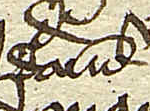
dauo*
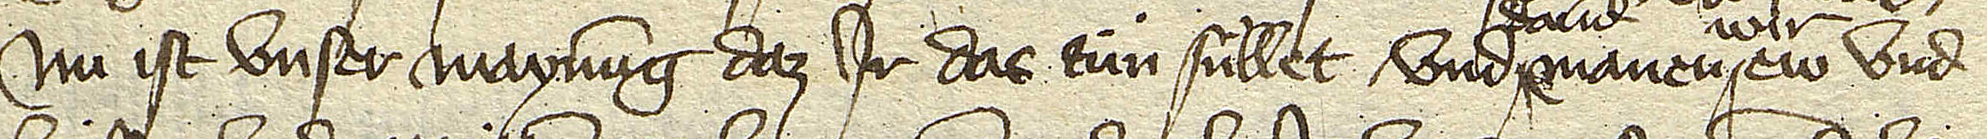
Nu iſt vnſer maynug* daʒ Ir das tün ſüllet / vnd manen ew vnd
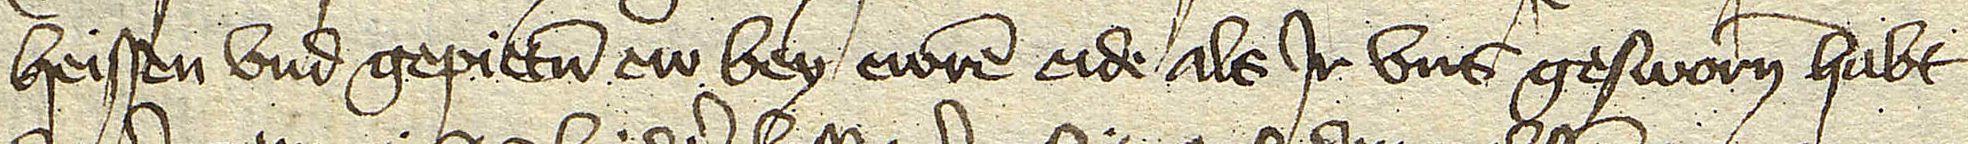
heiſſen vnd gepieten* ew bey ewre* eide als Ir vns geſworn* habt
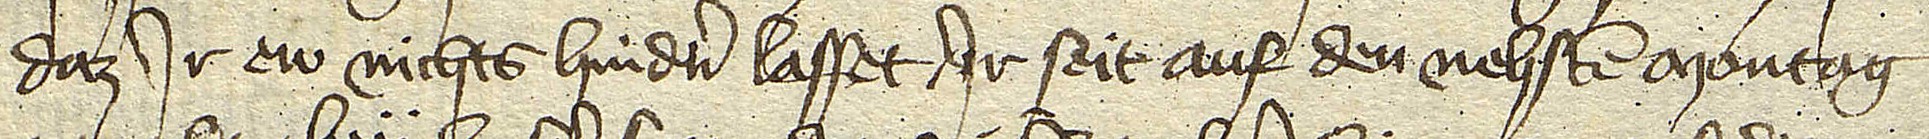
daʒ Ir ew nichts hindn* laſſet / Ir ſeit auf den nehſte* Montag
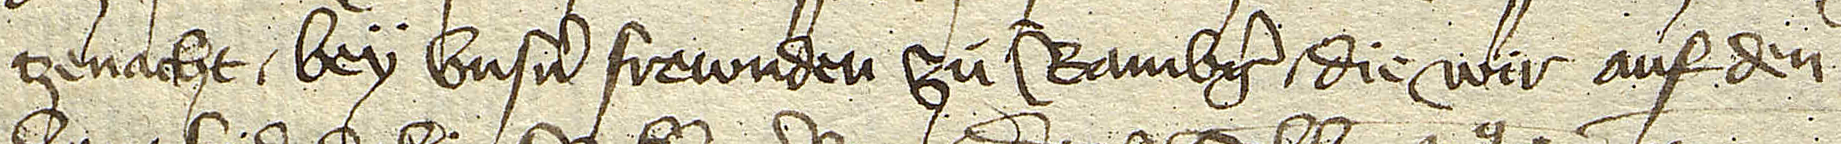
cʒenacht / bey vnſn* frewnden cʒü Bambg* / die wir auf den
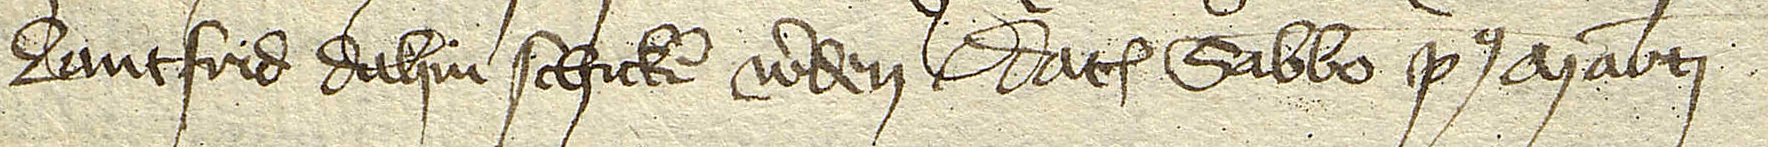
Lantfrid dahin ſchicke* w*den / Dat* Sabbo* p* Marti*
